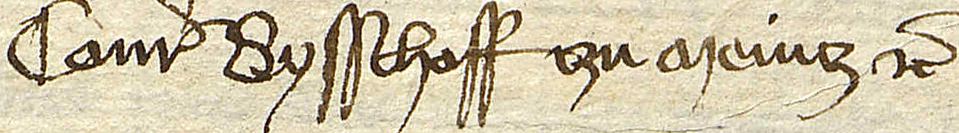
Conr* Byſſchoff cʒu Meincʒ ec*
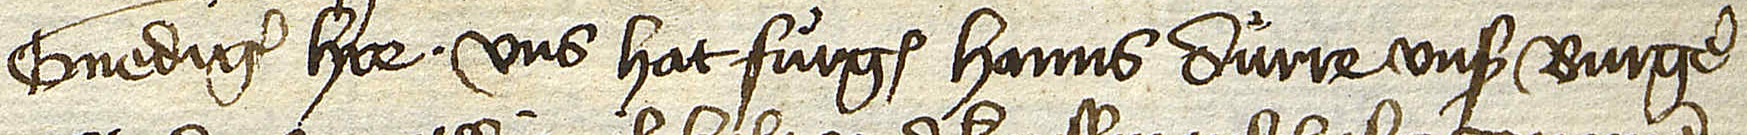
Gnedig* h*re . vns hat fürg* hanns Dürre vnſ* Burge*
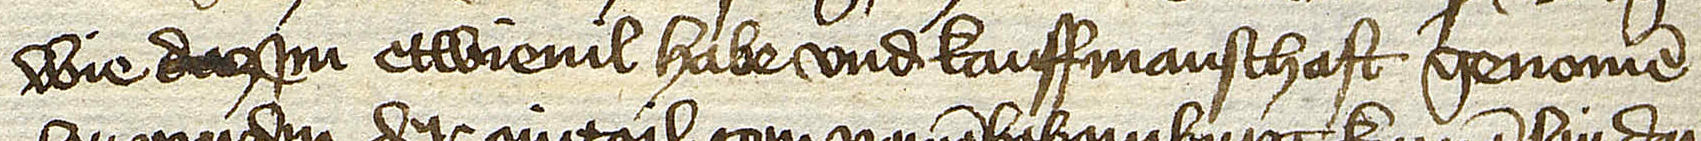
wie daʒ Im etwieuil habe vnd kauffmanſchaft genome*
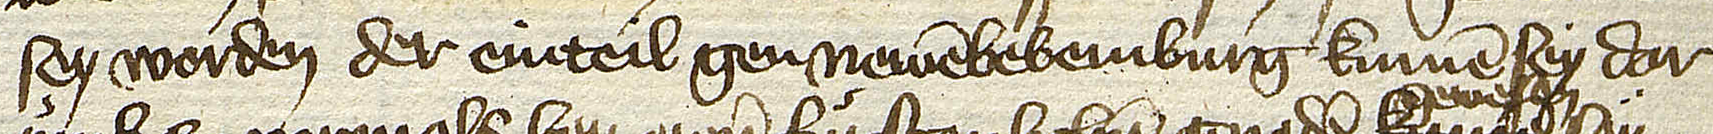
ſey worden der einteil gen Newe*bebemburg kume* ſey dar
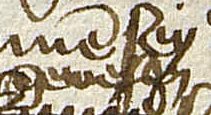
geweſen
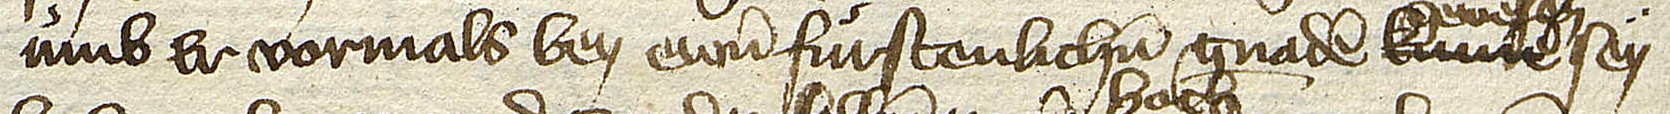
ümb Er vormals bey ew*n fürſtenlich*n gnade* kume* ſey
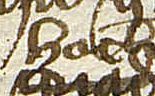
hoch*
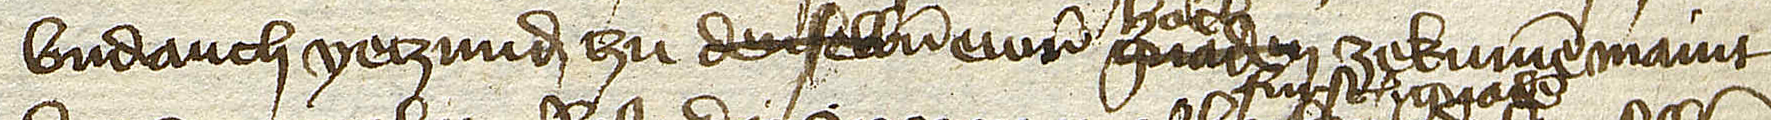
vnd auch yecʒund* cʒu denſelb*n ew*r gnaden ʒekume* maint
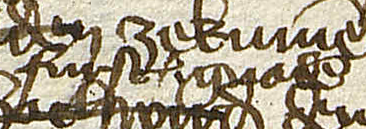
furſt* gnade*
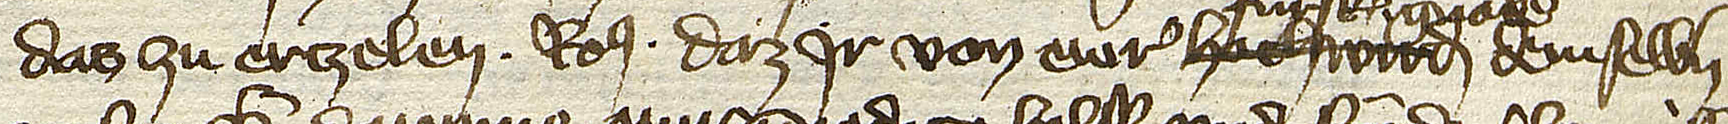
das cʒu ercʒelen . Ro* . daʒ Ir von ew*r hochwird* demſelb*n
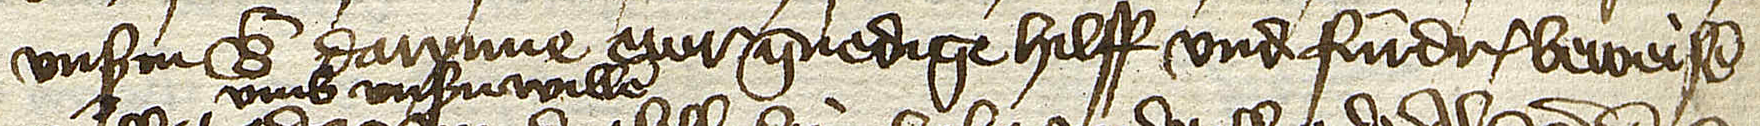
vnſ*m B* darynne ewr gnedige hilff vnd füdr* beweiſe*
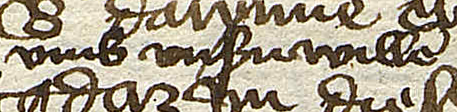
vmb vnſ*n wille*
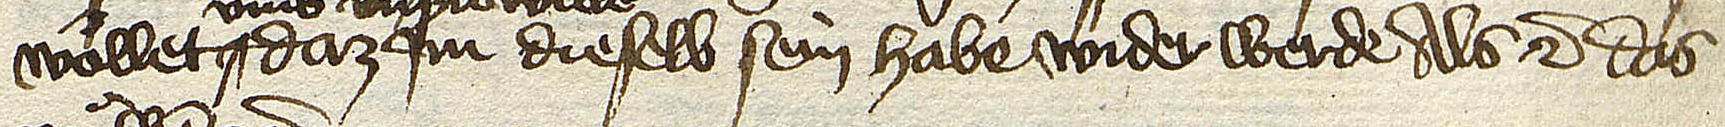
wöllet daʒ Im dieſelb ſein habe wider werde Als ec* das
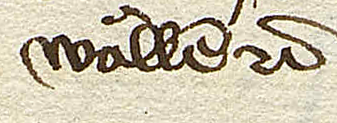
wölle* ec*
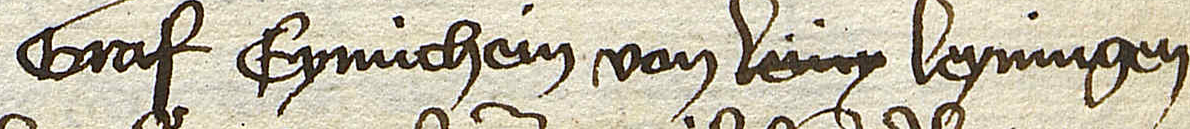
Graf Eymichein von leiny leyningen
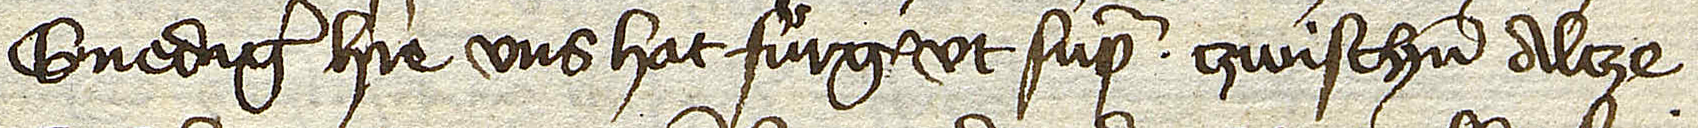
Gnedig* h*re vns hat fürg* vt ſup* .cʒwiſch*n Alcʒe
